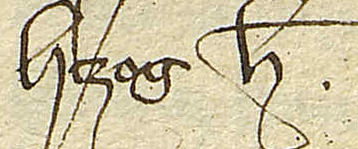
h*cʒog h*.
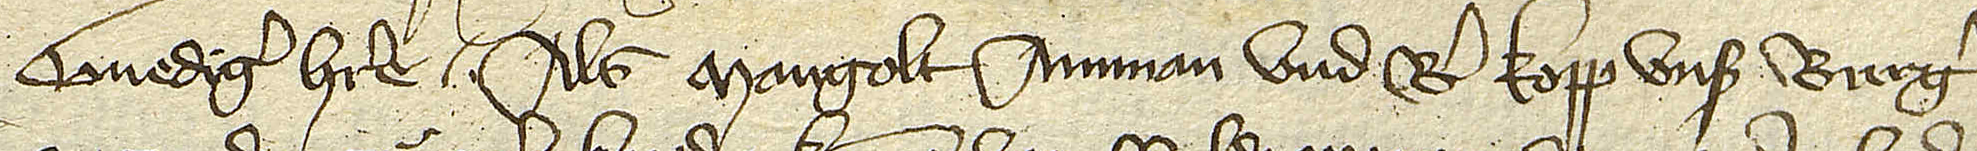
Gnedig* hr*e / . Als Mangolt Armman vnd B* Kopp vnſ* Burg*
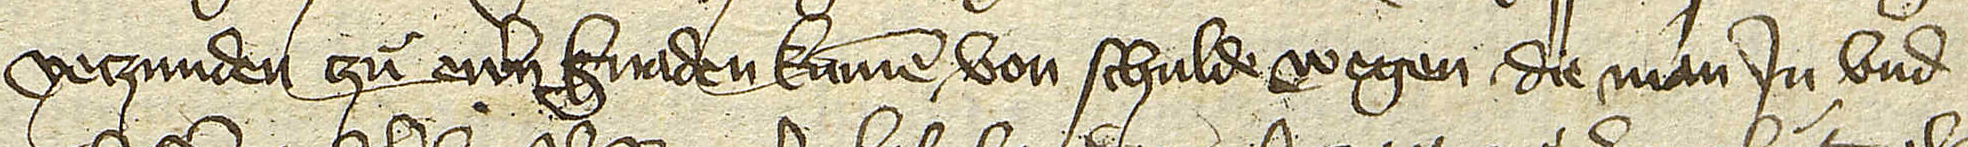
yecʒunden cʒü ew*n gnaden kume* / von ſchulde wegen / die man In vnd
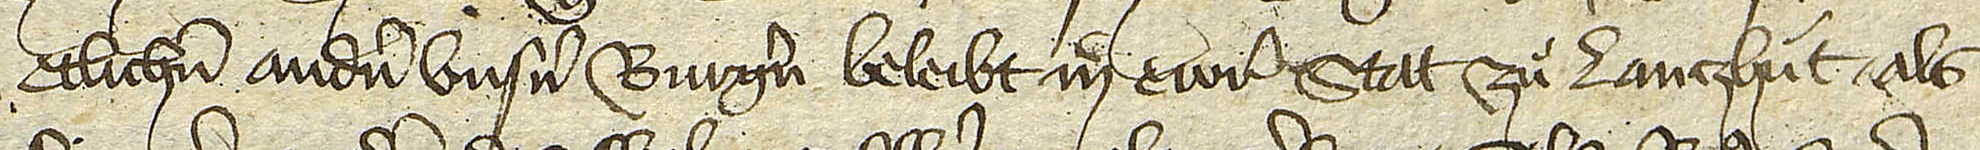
etlichn* andn* vnſn* Burg*n beleibt in ewr* Stat cʒü Lancʒhüt / als
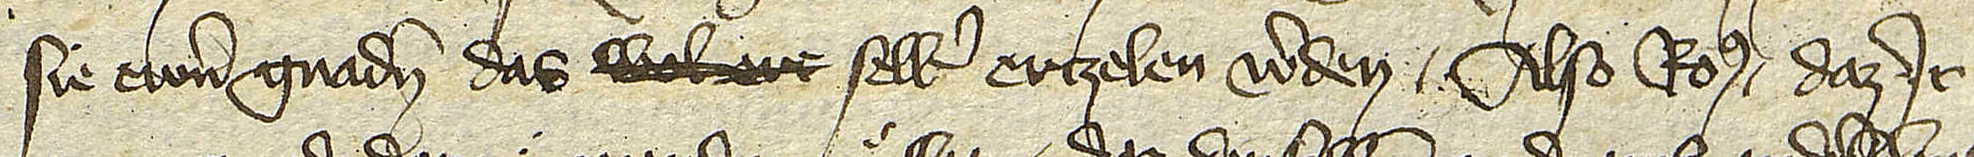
ſie ewn* gnadn* das wol erc ſelb* ercʒelen w*den / Alſo Ro* / daʒ Ir
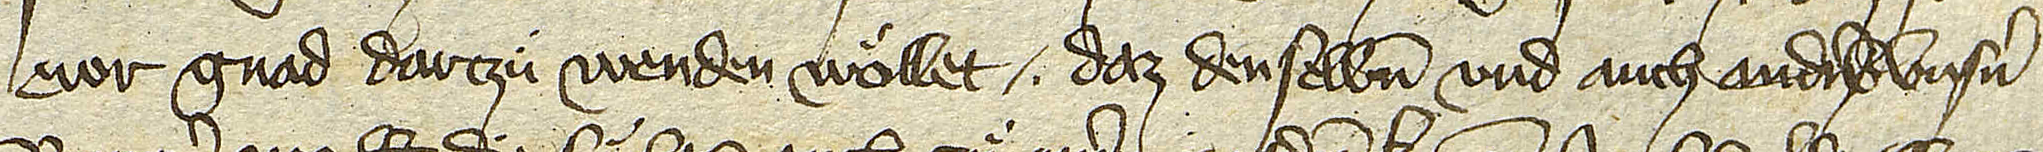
ewr gnad darcʒü wenden wöllet / . daʒ denſelbn* vnd auch andn* vnſn*
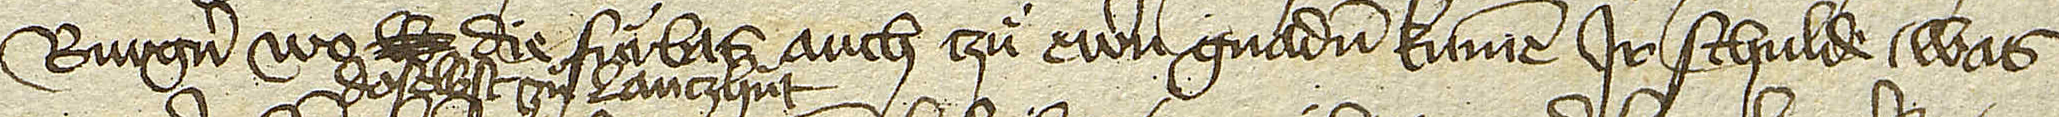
Burgn* wo w die fürbas auch cʒü ew*n gnadn* kume* Ir ſchulde / was
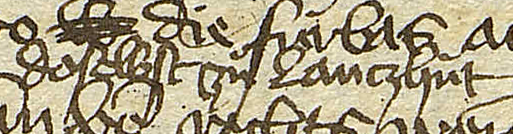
doſelbſt cʒü Lancʒhüt
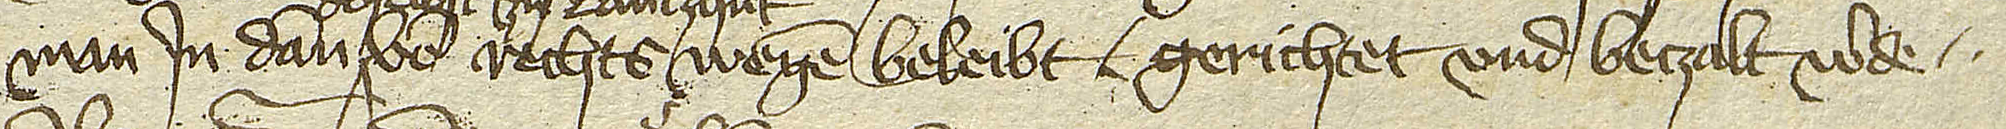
man In dan* vo* rechts wege* beleibt / gerichtet vnd becʒalt w*de / .
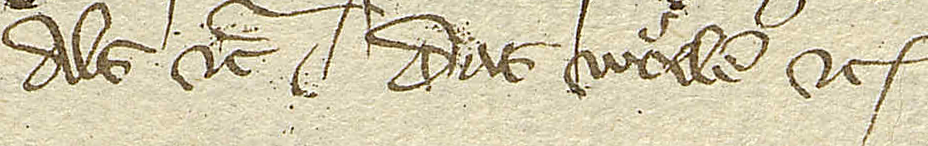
Als ec* / Das wölle* ec*
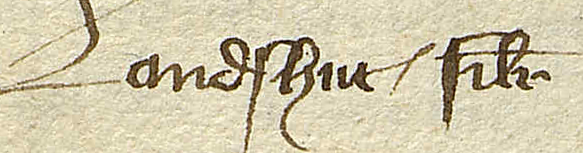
Landſhut / ſilr*
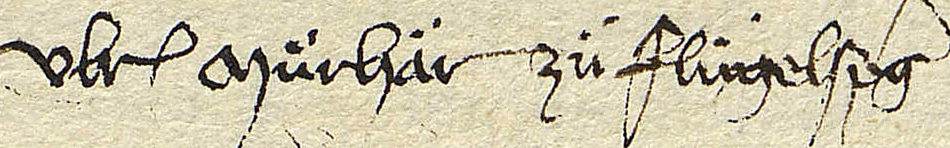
vlr* Mürhär cʒü Flügelſpg*
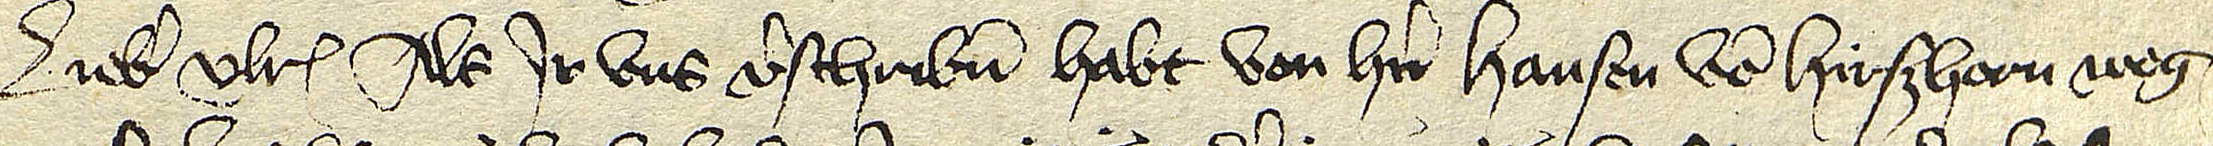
Lieb* vlr* Als Ir vns v*ſchribn* habt von hn* hanſen vo* hirſʒhorn weg*
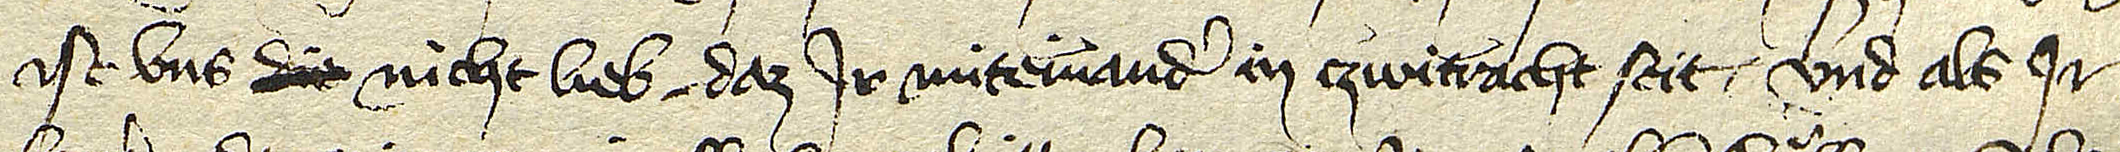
iſt vns die nicht lieb / daʒ Ir miteinand* in cʒwitracht ſeit / vnd als Ir
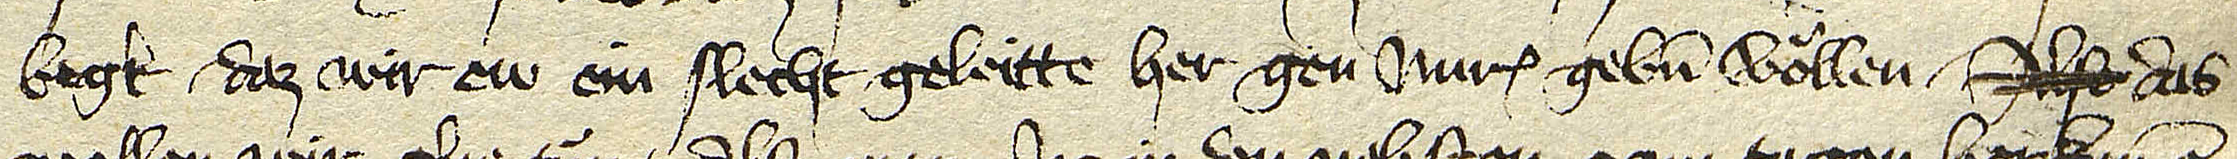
begt* / daʒ wir ew ein ſlecht geleitte her gen Nur* gebn* wöllen / Alſo das
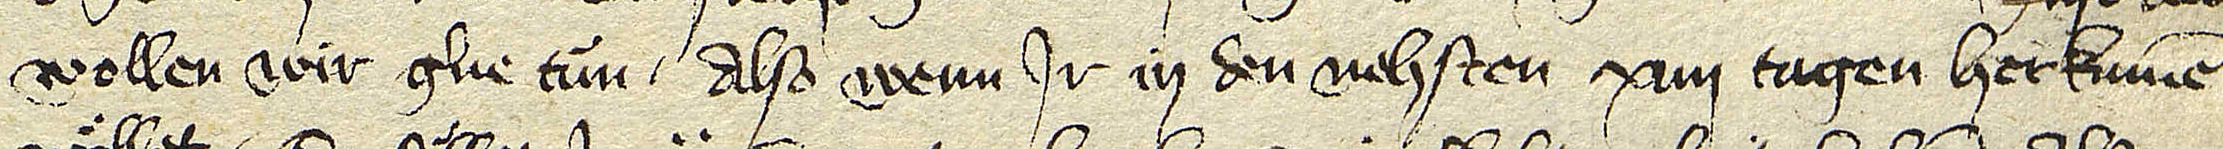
wollen wir g*ne tün / Alſo wenn Ir in den nehſten xiiii tagen herkume*
